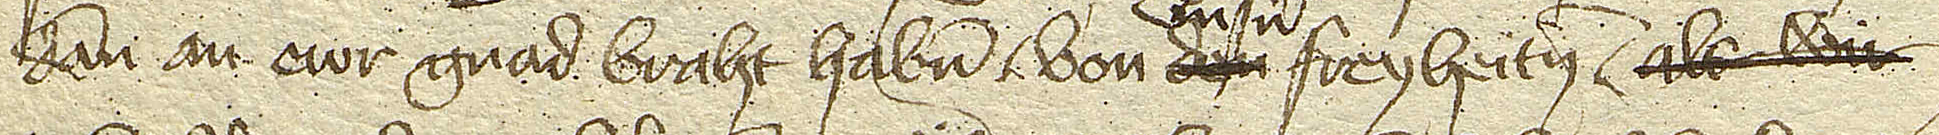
dan* an ewr gnad braht habn* / von den freyheitn* / als wir
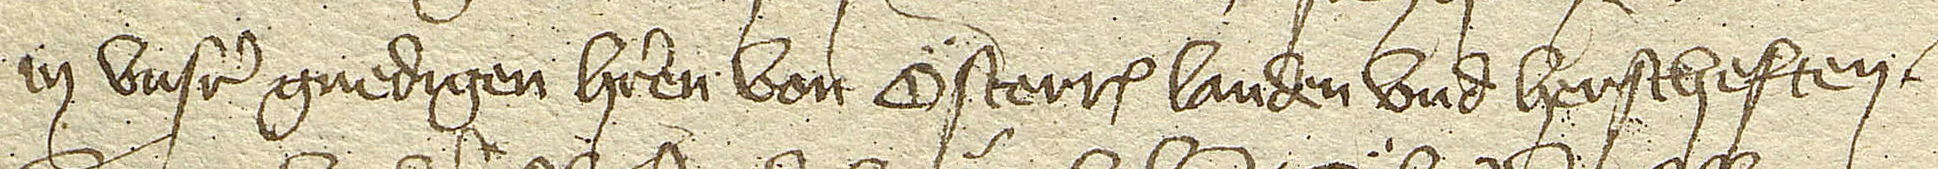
in vnſr* gnedigen hr*en von Öſterr* landen vnd herſcheften /
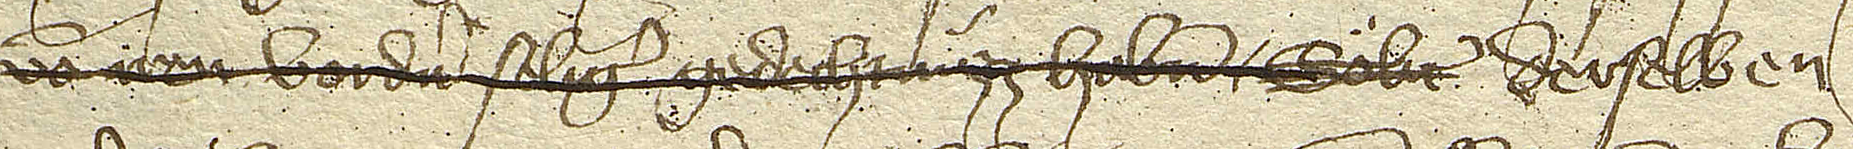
vo* iren vordn* ſelig* gedechtnüʒʒ habn* / Sölic* derſelben
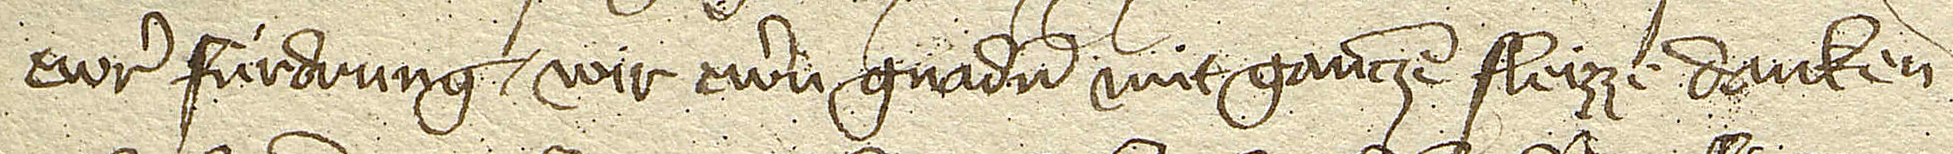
ewr* fürdrung / wir ew*n gnadn* mit gancʒe* fleiʒʒe danken
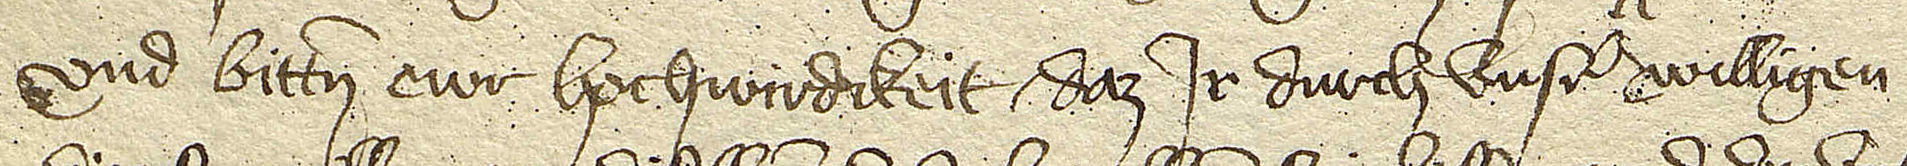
vnd bittn* ewr hochwirdikeit / daʒ Ir durch vnſr* willigen
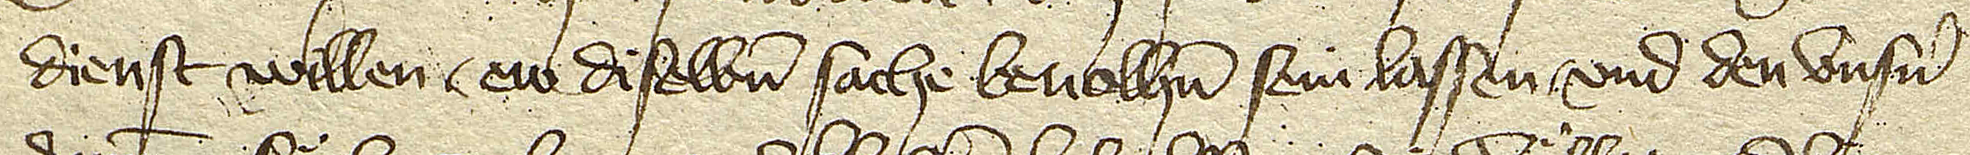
dienſt willen / ew diſelbn* ſache beuolhn* ſein laſſen / vnd den vnſn*
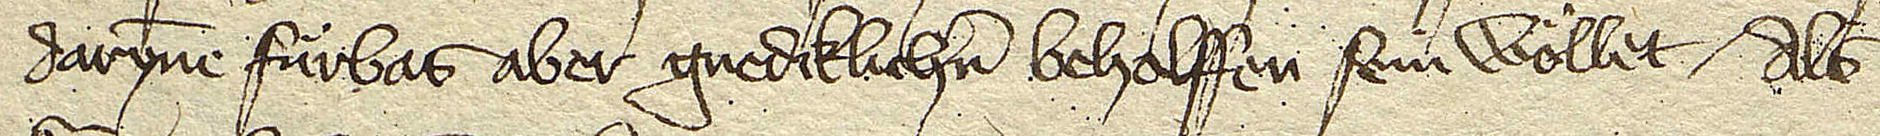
daryne* fürbas aber gnediklichn* beholffen ſein wöllet / Als
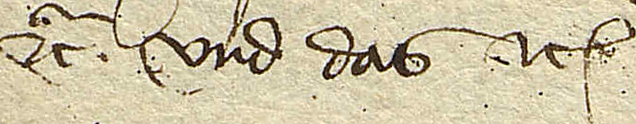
ec* . vnd das ec*
